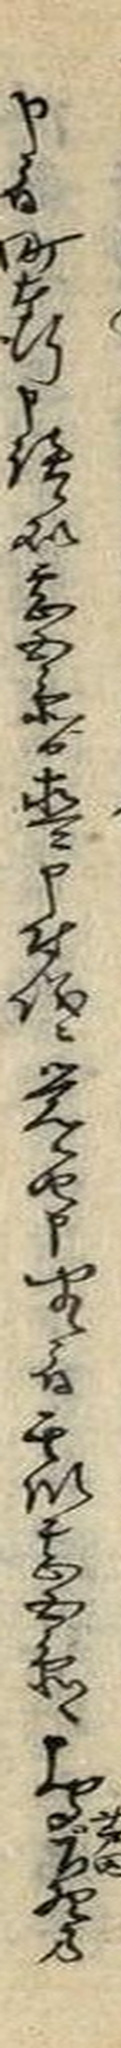申に付町奉行申談候処甚五兵衛ゟ直に申付儀と覚候由申聞候に付其段甚五兵衛へ申聞◦芦田下野方
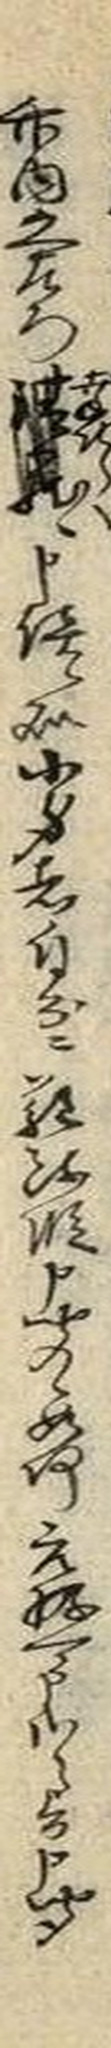竹内久左衛門幸次郎へ申談候処小身者自分に難致段申聞候如何取扱可申哉之旨申聞
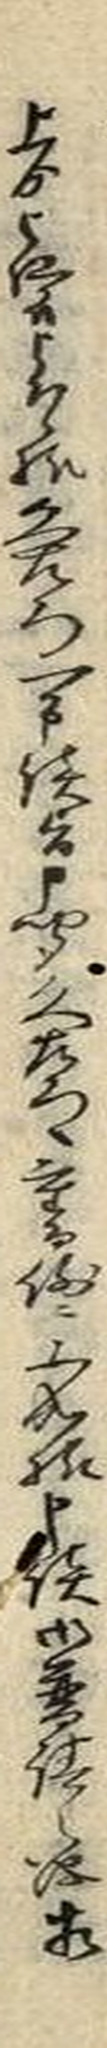上ゟ被仰付被下候様久左衛門可申談旨申聞久左衛門へ重て例に不成様申談御普請之儀相
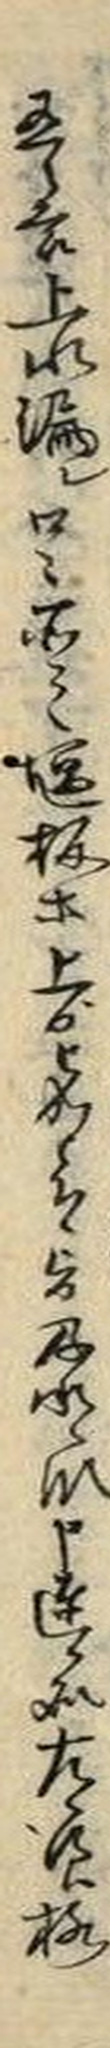有之節上水漏レ口々所之堰板等上ゟ被成被下候旨及承候段申達候処左候得は格

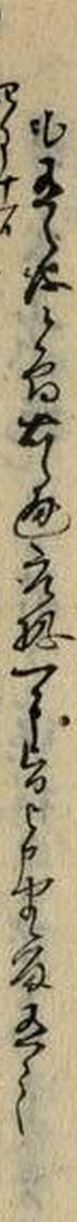も有之儀に候間右之通取扱可申旨被申聞候留有之
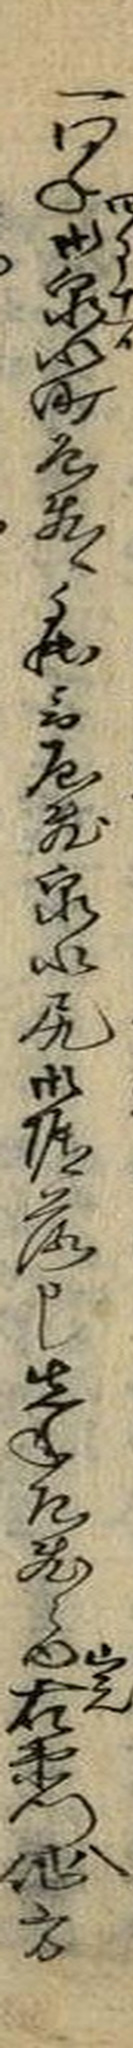一同年四月十一日御泉水町屋敷へ手紙にて屋敷泉水尻御堀へ落申候先手屋敷之内山元右衛門へ作方
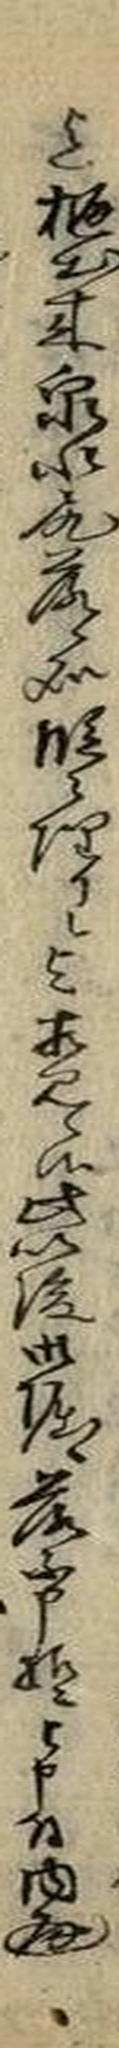迄樋出来泉水尻落候処段々埋り候と相見へ候此以後御堀へ落不申様に被申付内通
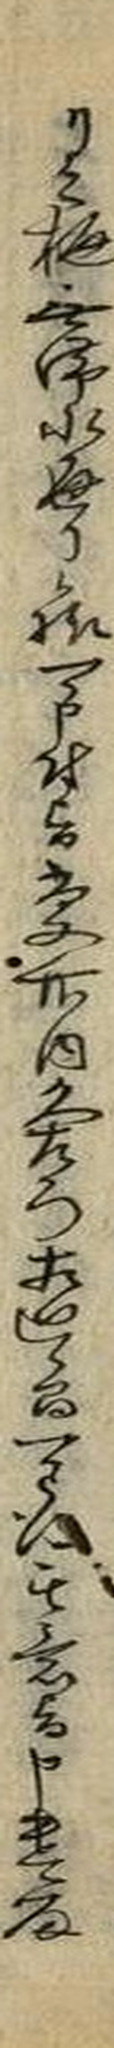り之樋無滞水通り候様可申付旨尚又竹内久左衛門相廻候間可被得其意旨申遣候留
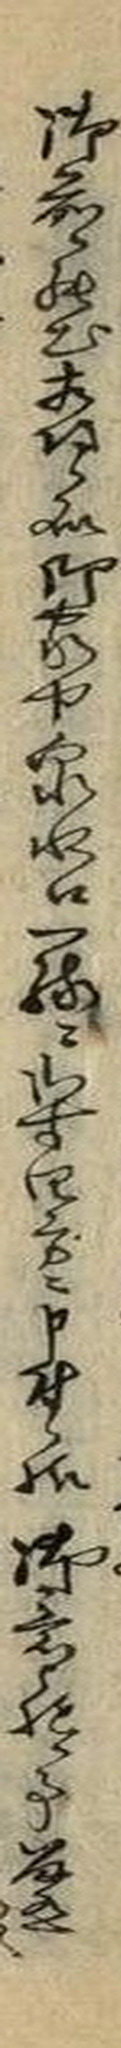御前へ罷出相伺候処御家中泉水口一統に弐寸四方と申付候様御意被遊候事留有之
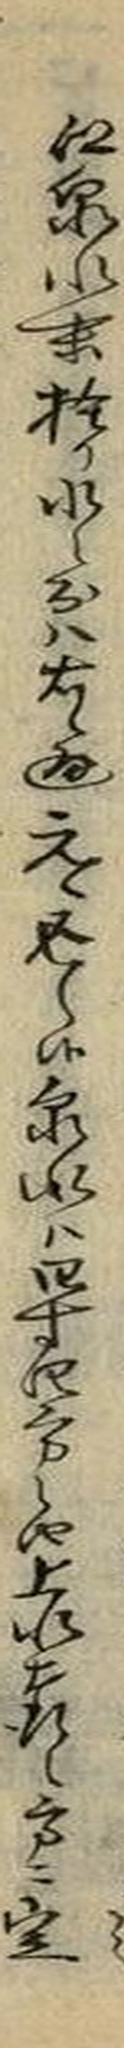但泉水末捨り水之分は右之通元へ返し候泉水は四寸四方之由上水奉行之方に定
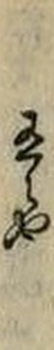有之由
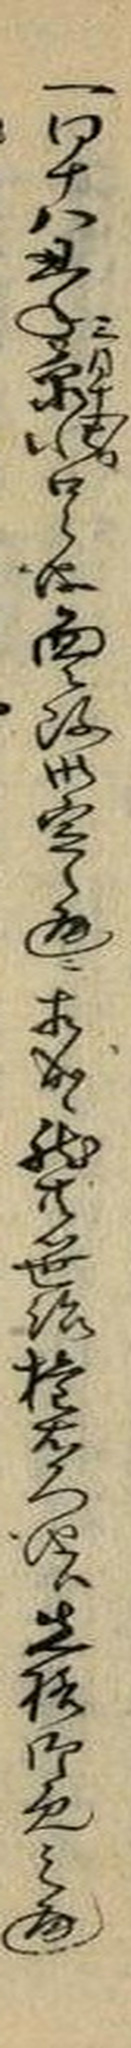一同十八丑年◦三月十五日泉水口之儀面々改御定之通に相成候然共笹治権右衛門儀は先格御免之通
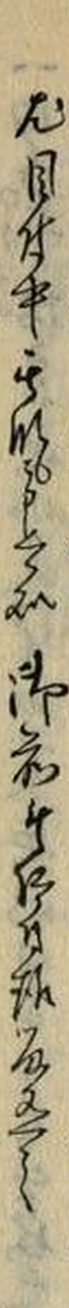尤目付中其段も申上候処御前被仰付趣留有之
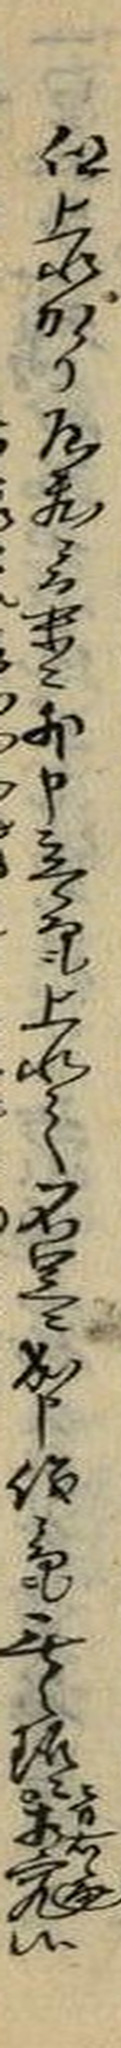但上水かゝり屋敷にて末々外申立候ても上水之不足に成申儀にても無之趣◦に付右之通に相究候
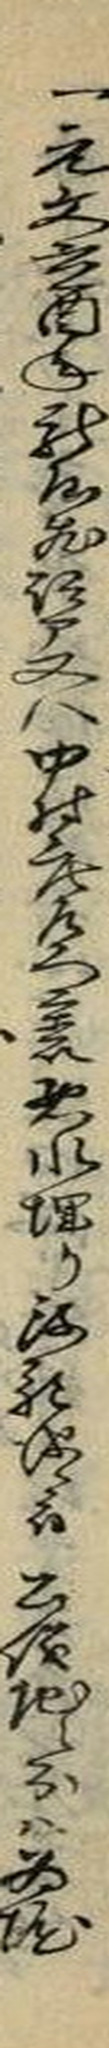一元文六酉年新屋敷跡部又八中村庄左衛門裏悪水埋り致難儀候に付公儀地之分は為堀
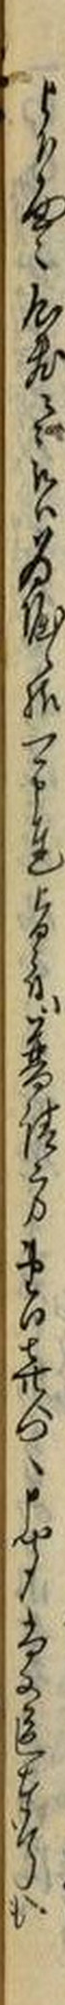被下面々屋敷々々えは為堀候様可申達旨に付小普請方野田喜右衛門へ申聞尚又道奉行へも
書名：御城下諸事之部
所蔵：福井県文書館 Fukui Prefectural Archives
